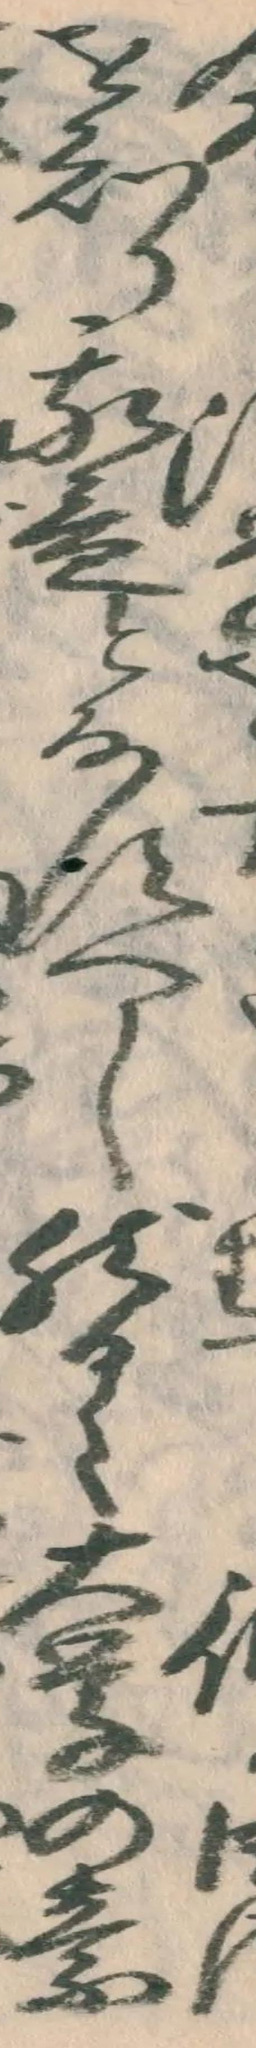を知り我益となすへし然るに大学の素
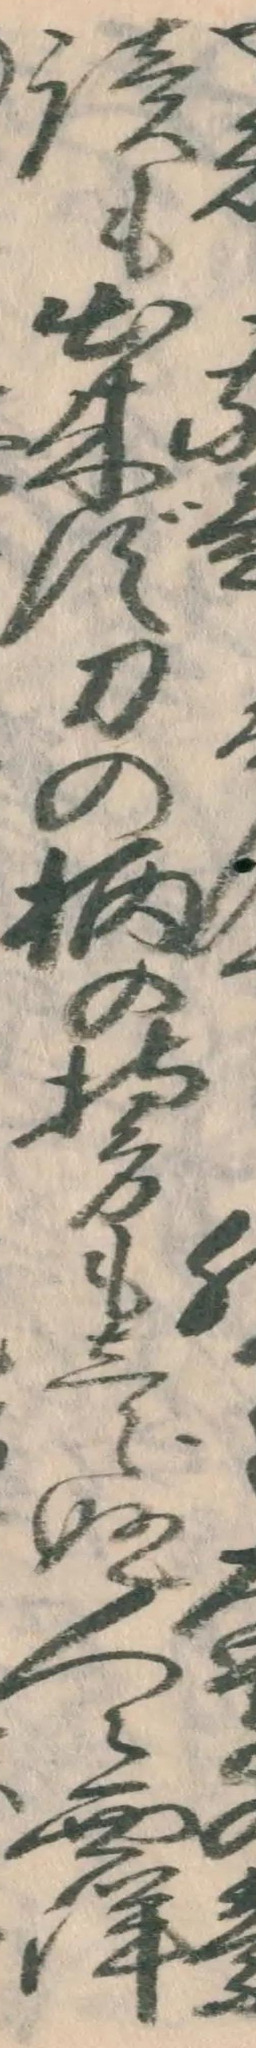読も出来ず刀の柄の持方もしらぬ人々西洋
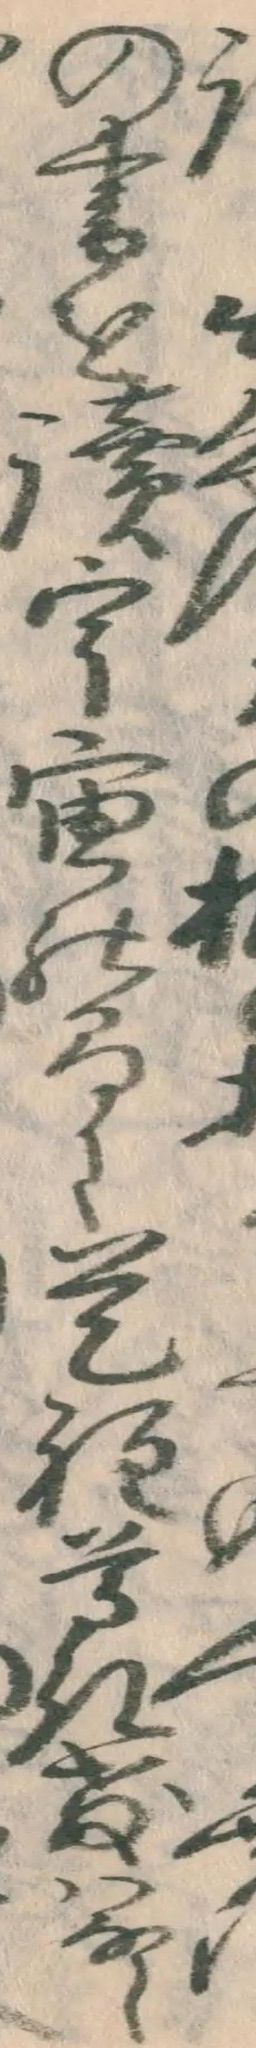の書を讀宇宙の間に是程尊き教ハなし
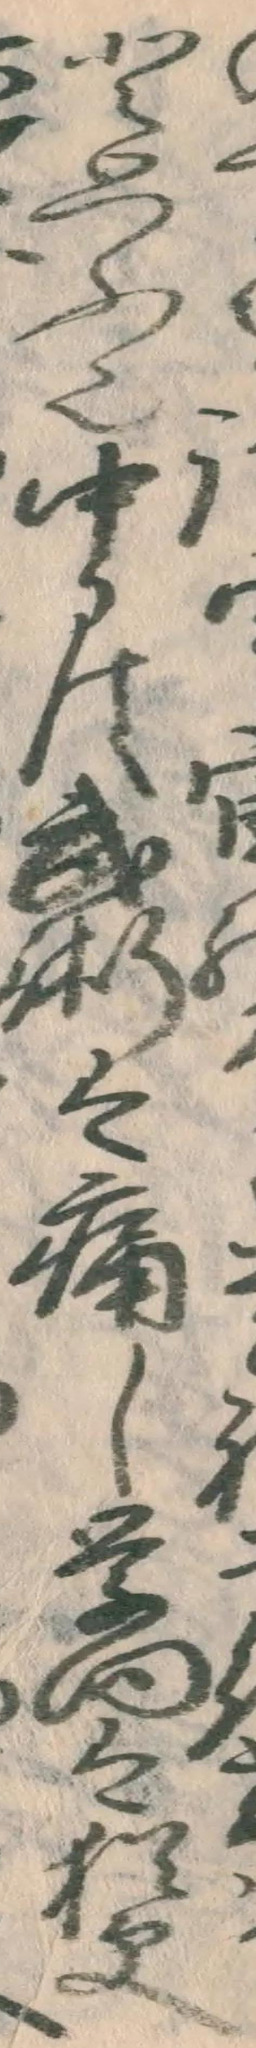と思ふ也中には武術は痛し学問は猶更
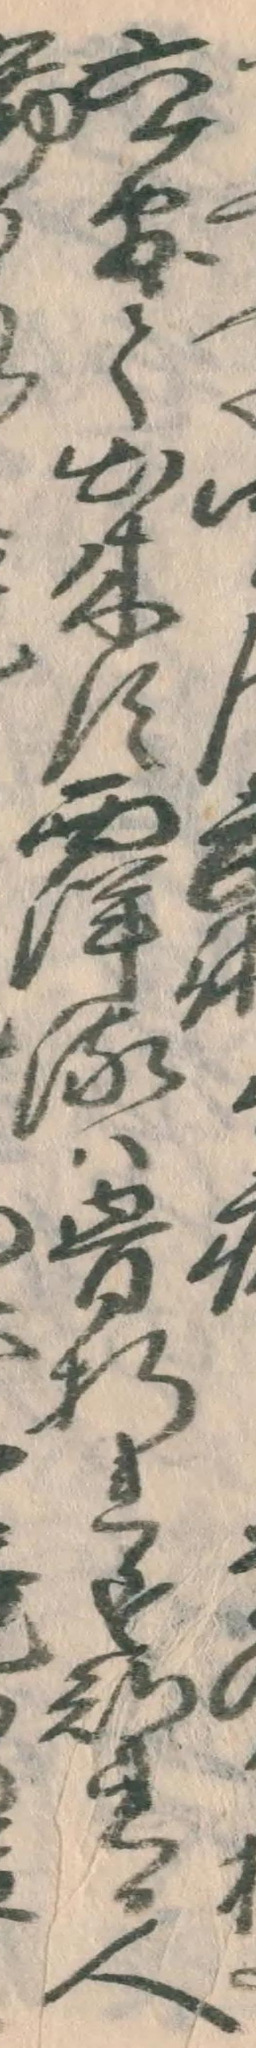六ケ敷て出来す西洋流ハ骨折れす知れる人
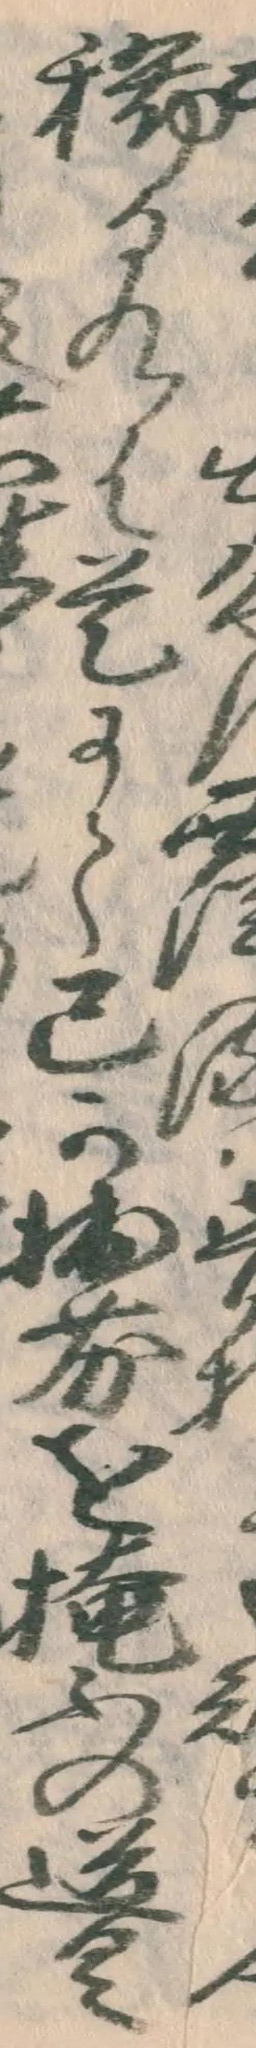稀なれは是にて己か拙劣を掩ふの道具
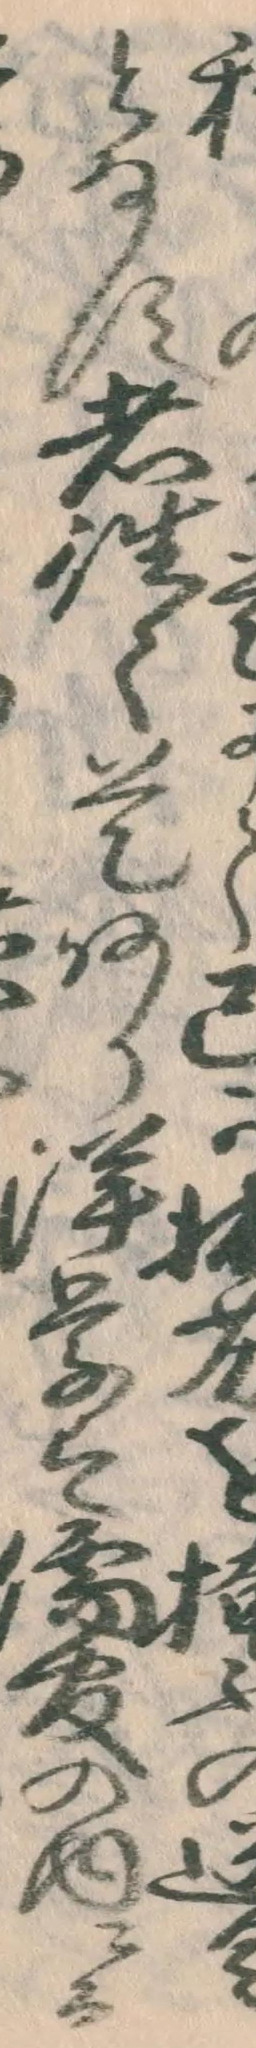となす者往々是あり洋学は儒官の内ニ而
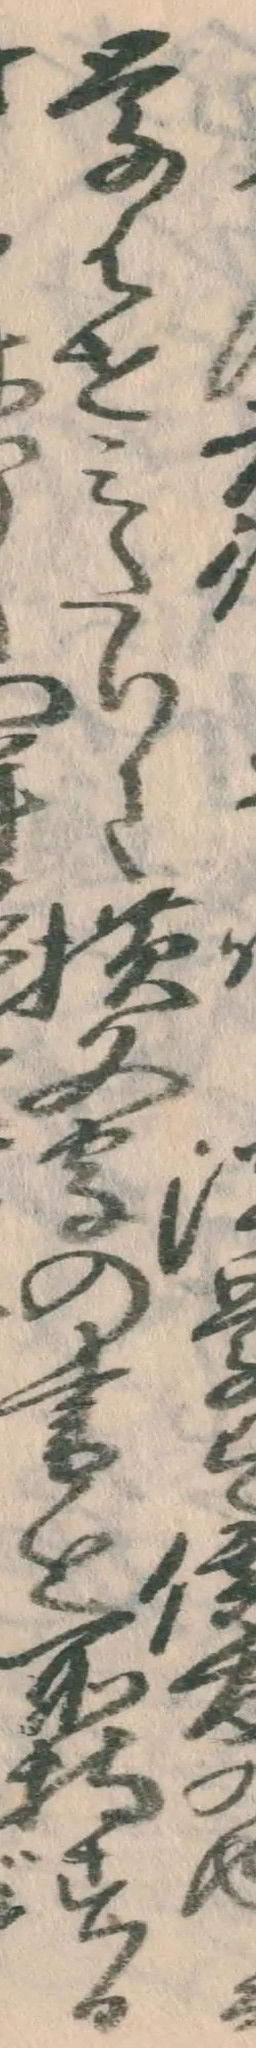学はせミたりに横文字の書を所持する
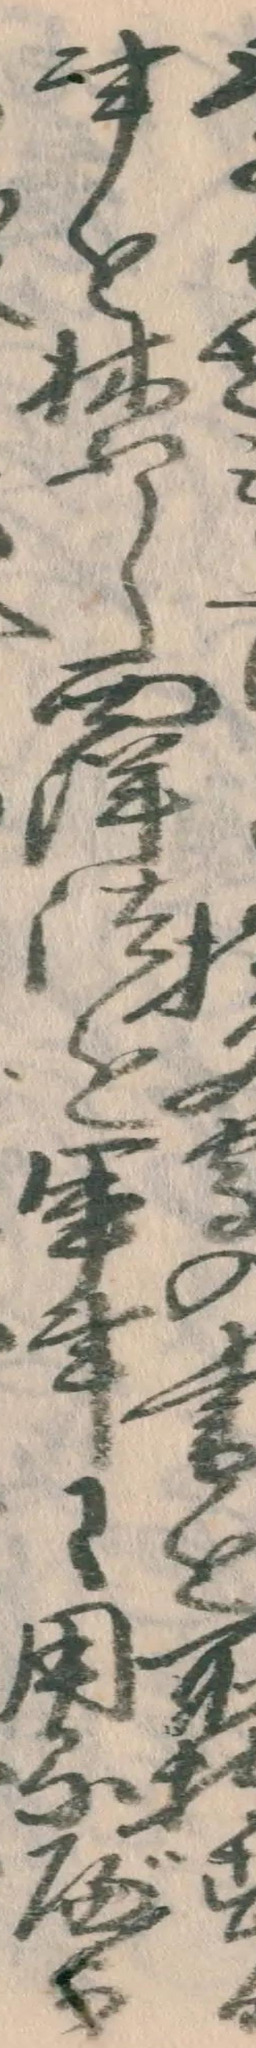事を禁し西洋法を軍事に用るべか
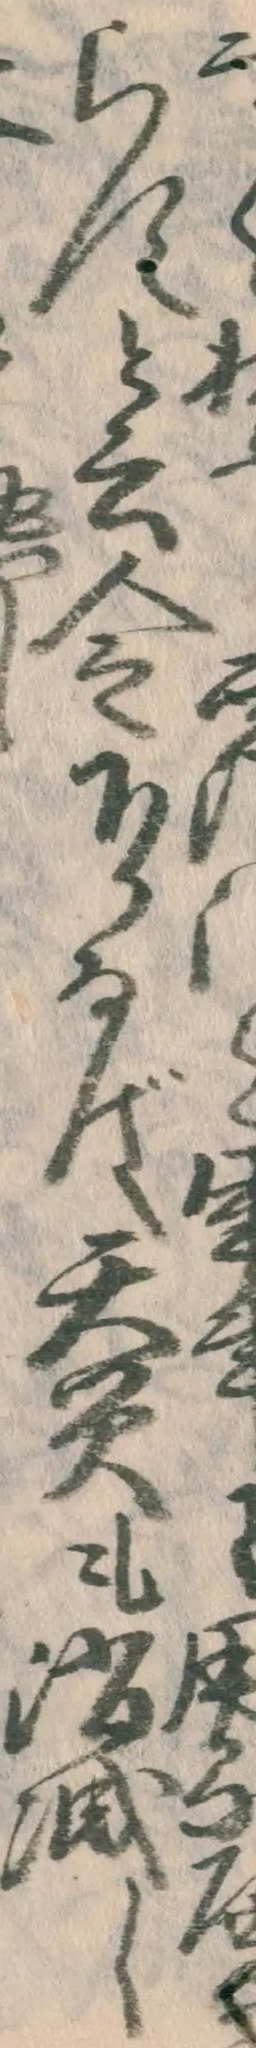らすと云令下りなば天災も消滅し
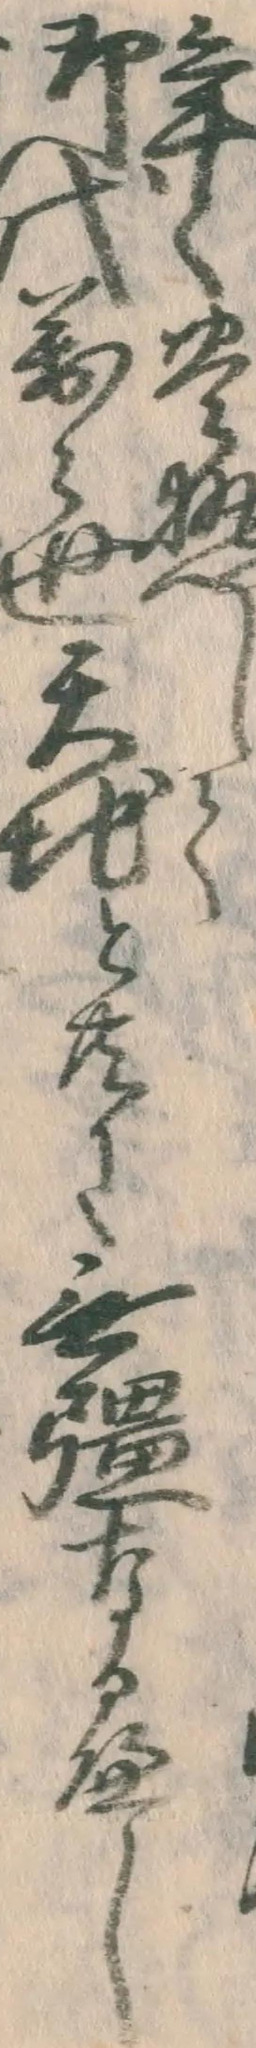御代萬々世天地と共に無彊なるへし
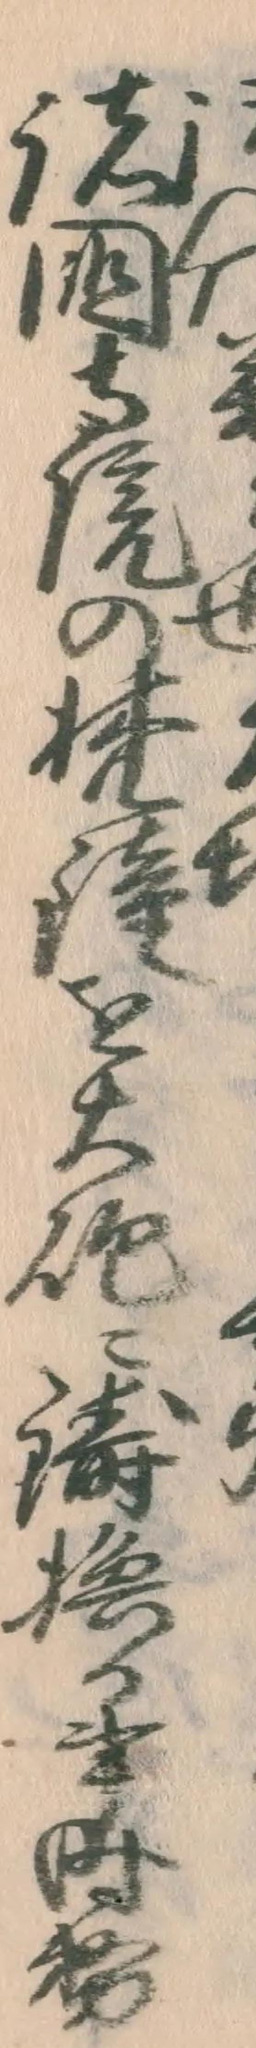一諸国寺院の梵鐘を大砲ニ鑄換る事時務
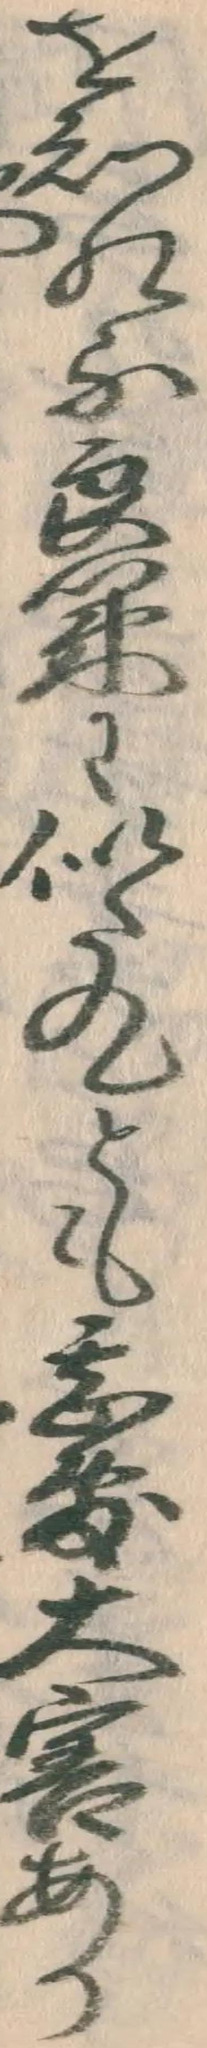を知れる良策に似たれとも甚敷大害あり
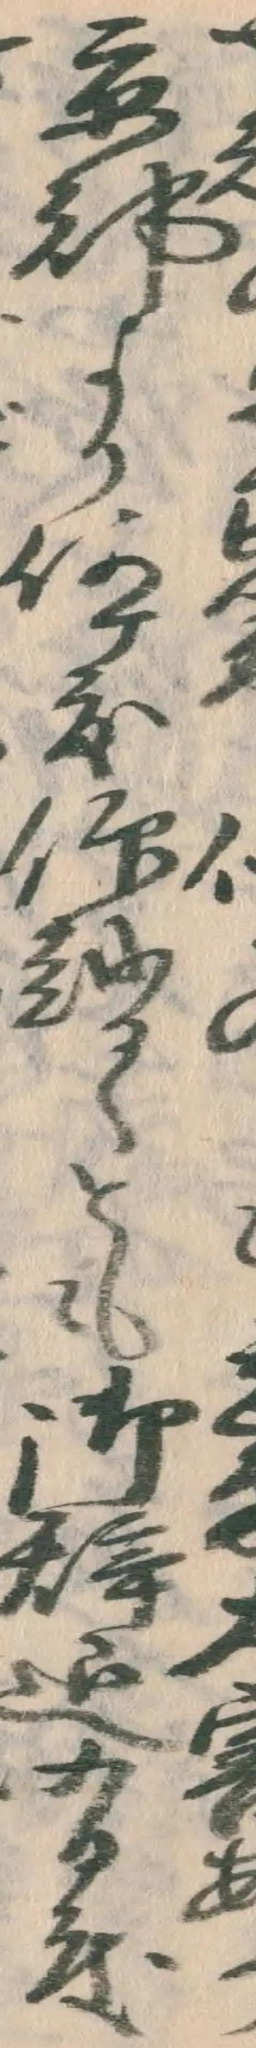京都より何ケ度仰越るゝとも御辞退有度
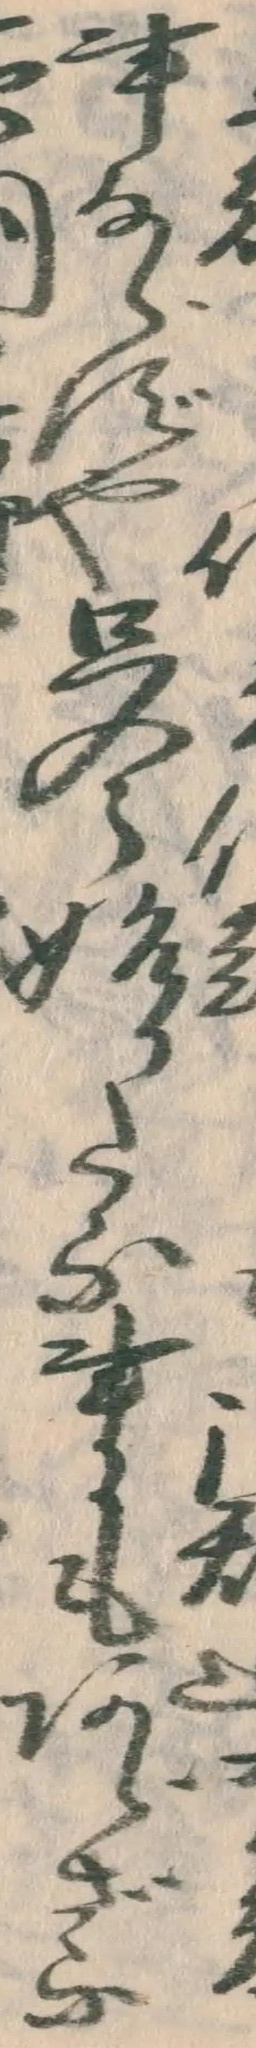事ならずや只今始りたる事にもあらざる
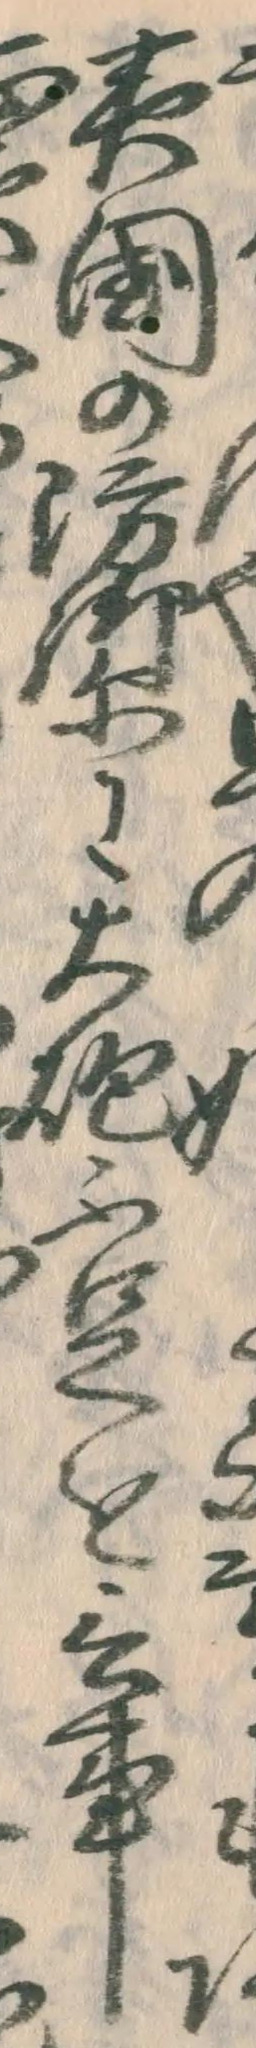夷國の防禦に大砲不足を云事
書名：麗斎叢書. 20
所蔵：国立国会図書館 National Diet Library, JAPAN
